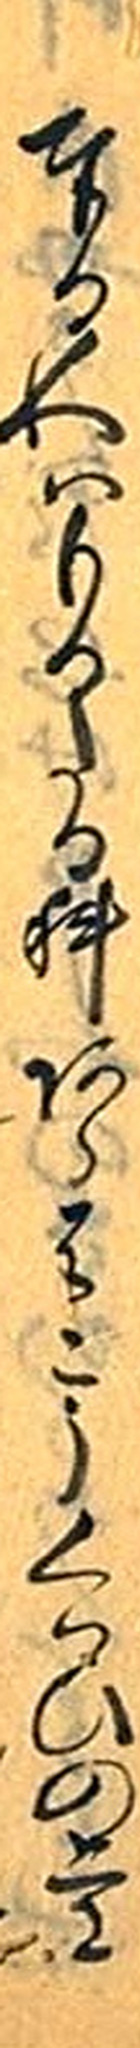奉る人はもるたる科あらはこうくはひの上に
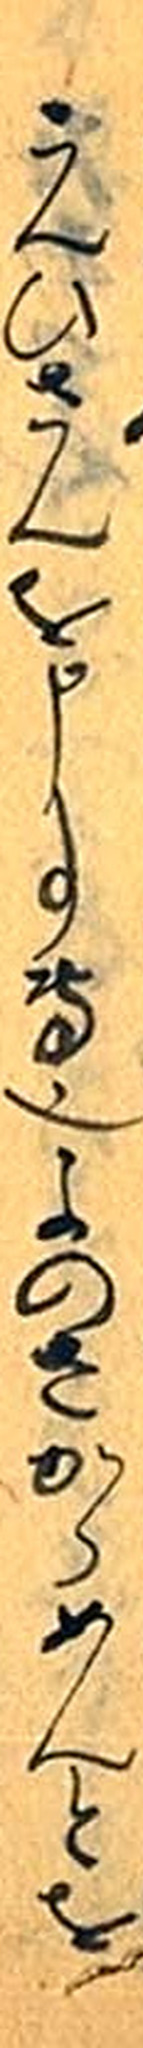こんひさんを申事専也よのさからめんとを
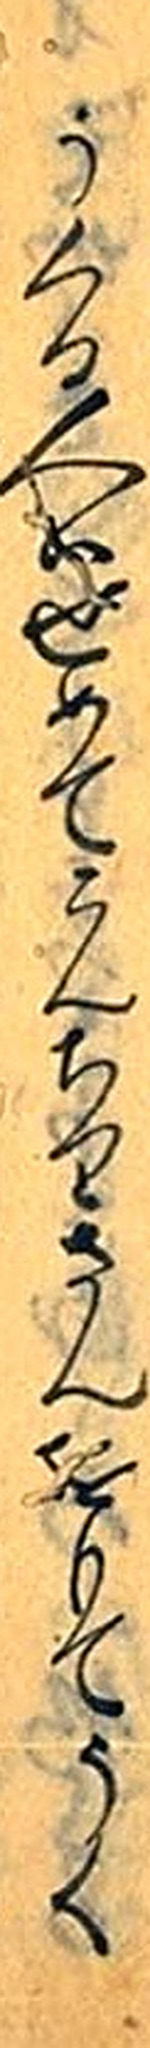うくる人はせめてこんちりさんをもてうく
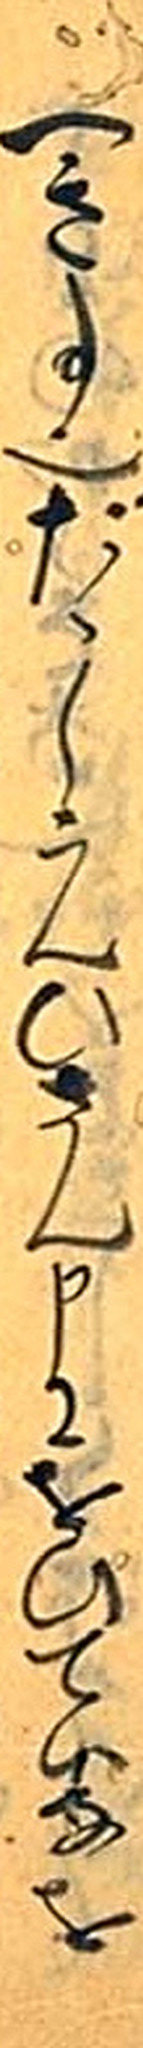へき事也たゝしこんひさん申にをひてはなを
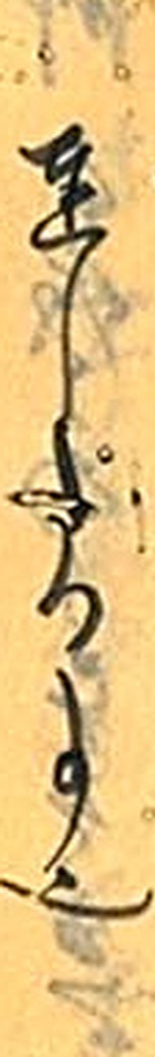達したる事也
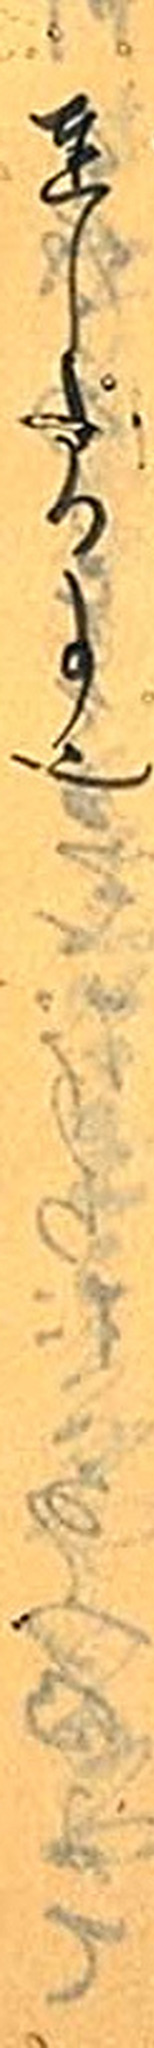達したる事也
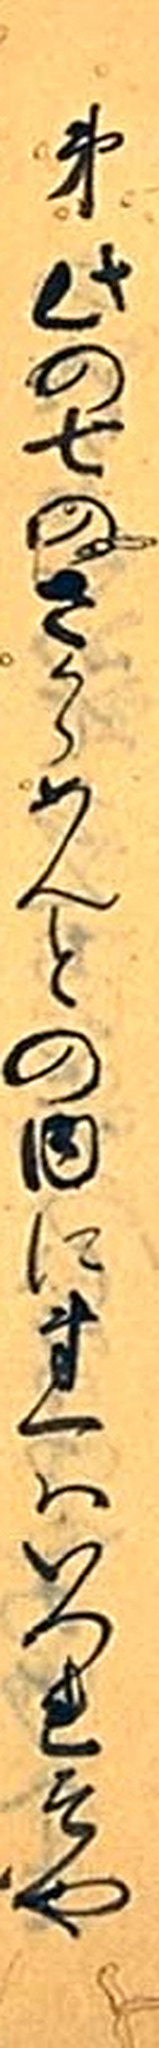弟此の七のさからめんとの内に第一はいつれそや
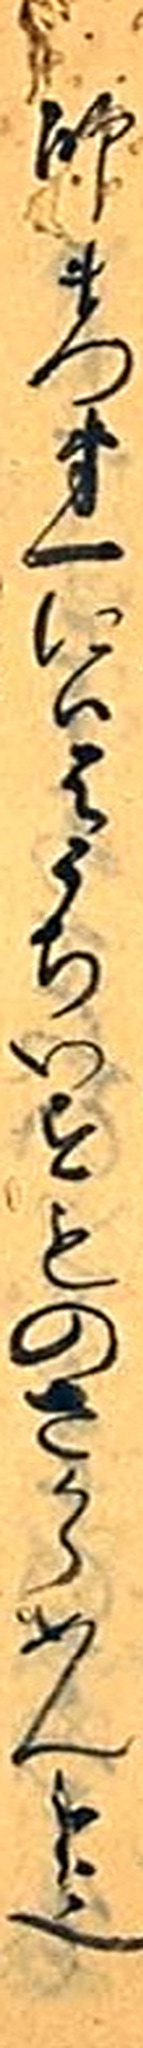師まつ第一にははうちいすものさからめんと也
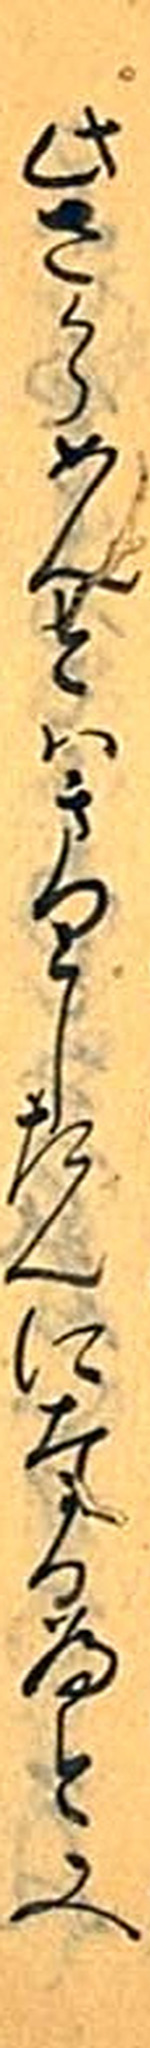此さからめんとはきりしたんになる為と又
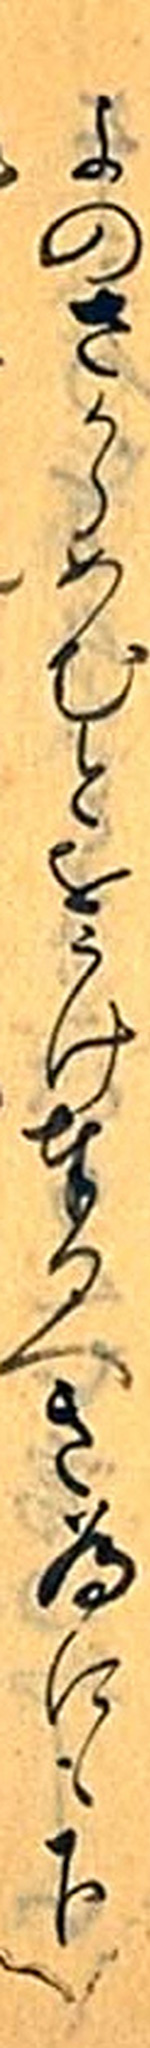よのさからめむとをうけ奉るへき為にも下
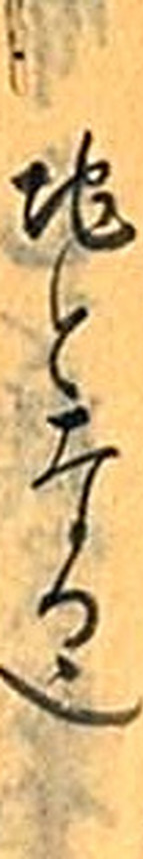地となる也
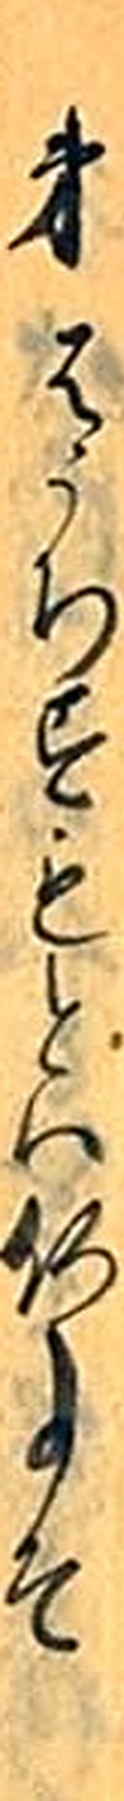弟はうちすもとは何事そ
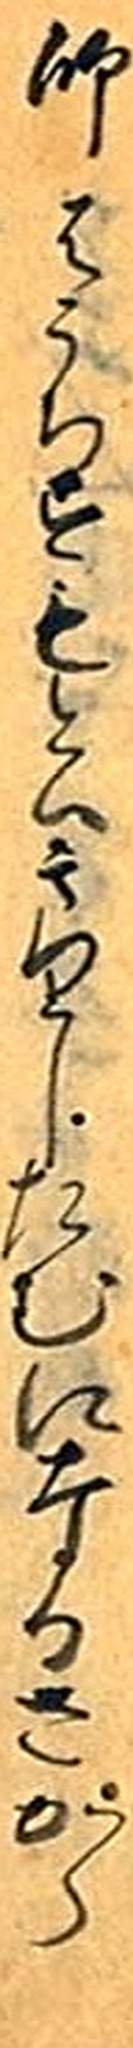師はうちすもとはきりしたむになるさから
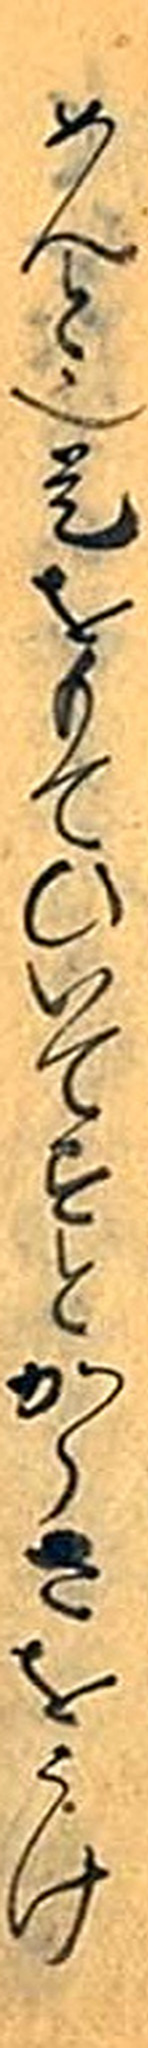めんと也是をもてひいてすとからさをうけ
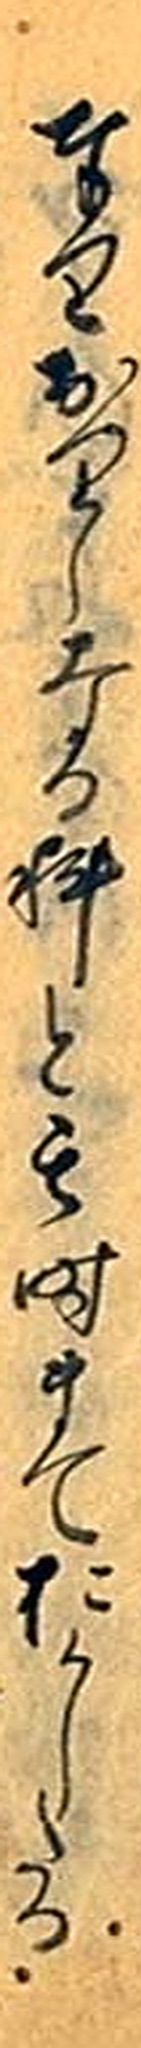奉りおりしなる科と其時まておかしたる
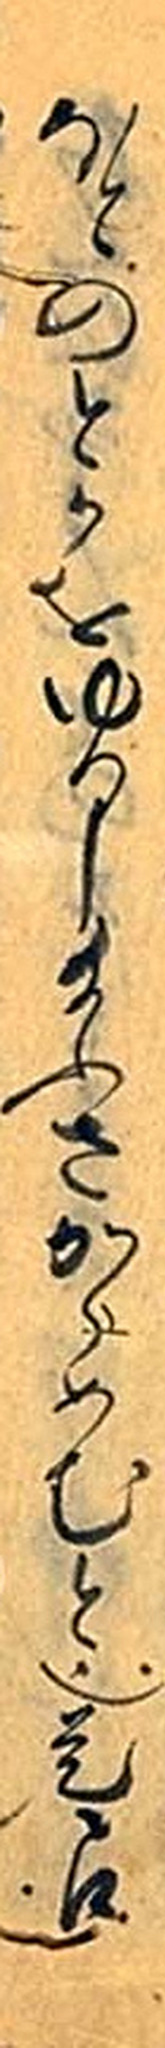ほとのとかをゆるし給ふさからめむと也是即
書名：ドチリナ・キリシタン
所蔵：東京大学総合図書館 / General Library in the University of Tokyo
